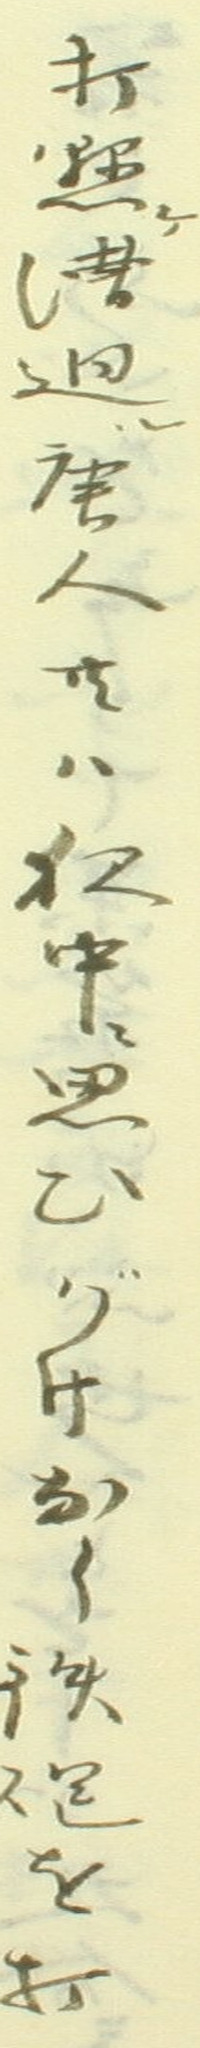打懸け漕廻し唐人共は夜中に思ひがけなく鉄砲を打
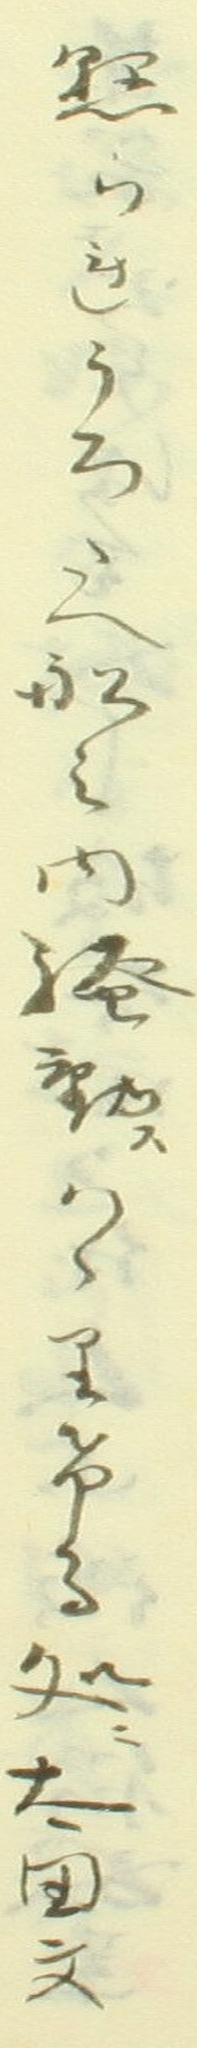懸られうろたへ船の内之騒動すははりける処に太田文
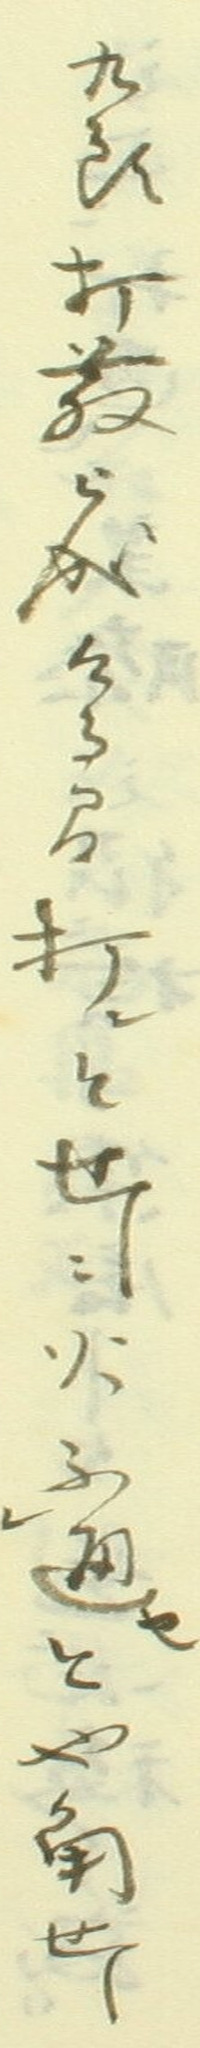九朗打敷被成ける間打しとせしに火不通せとや角せし
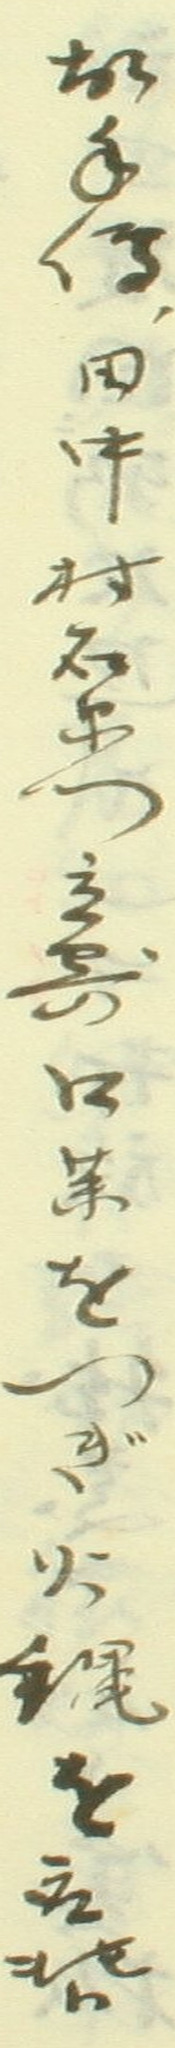故手伝の田中村右衛門立寄口薬をつぎ火縄を取背
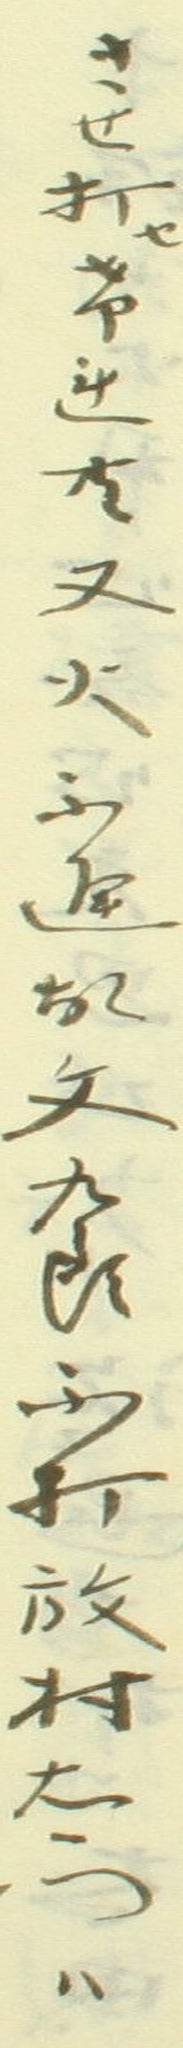させ打せけれ共又火不通故文九朗不打放村右衛門は
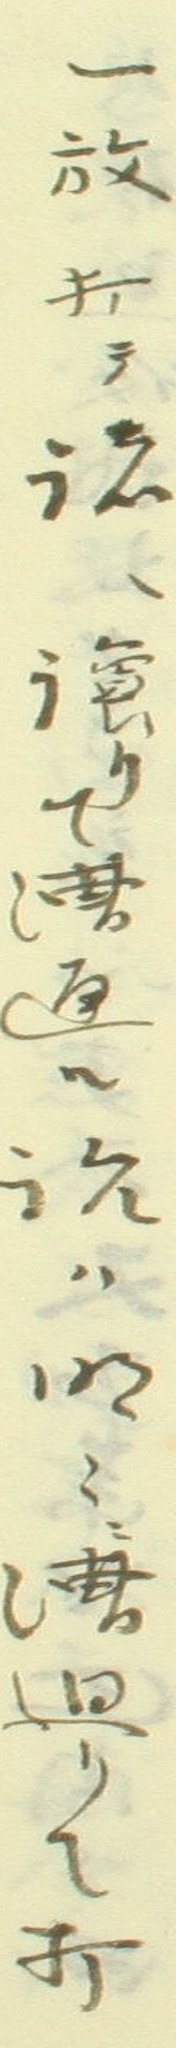一放打て諸へ？りて漕通る諸は明明に漕廻りて打
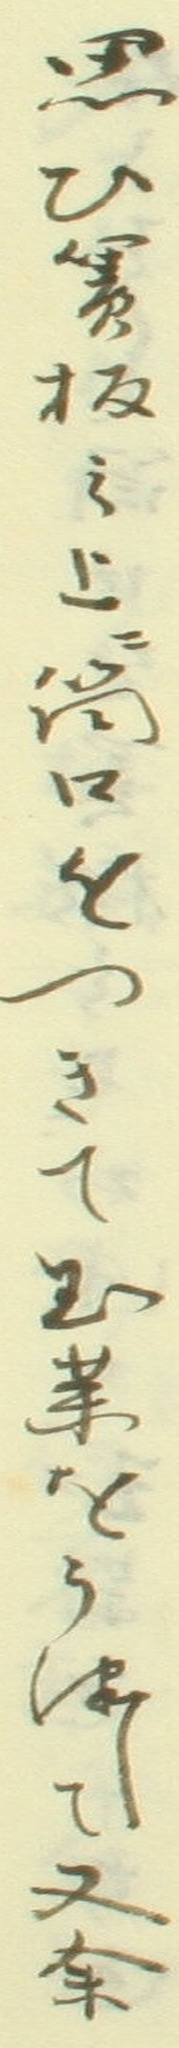思ひ関板の上に筒口つきて玉薬をうつして又余
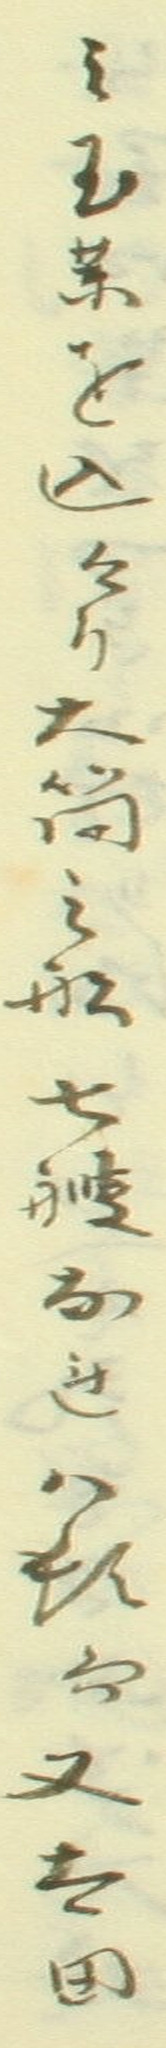之玉薬を込けり大筒の船七艘なれは頃？又太田
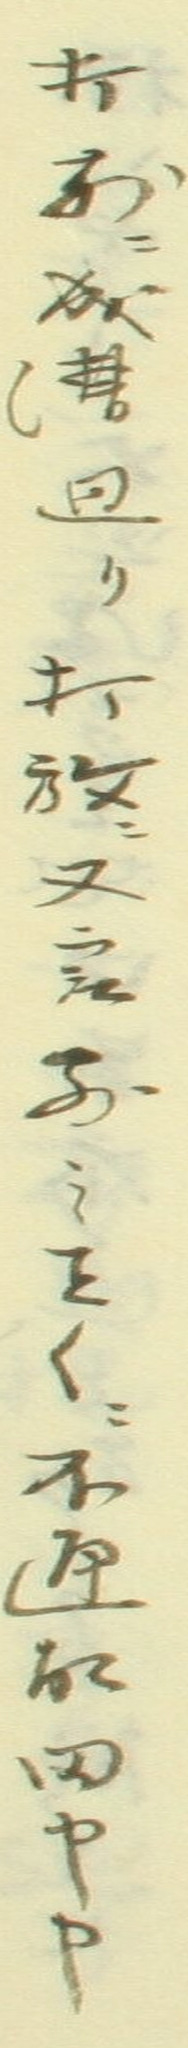打敷に成漕廻り打放に最前之ことくに不通故田中申

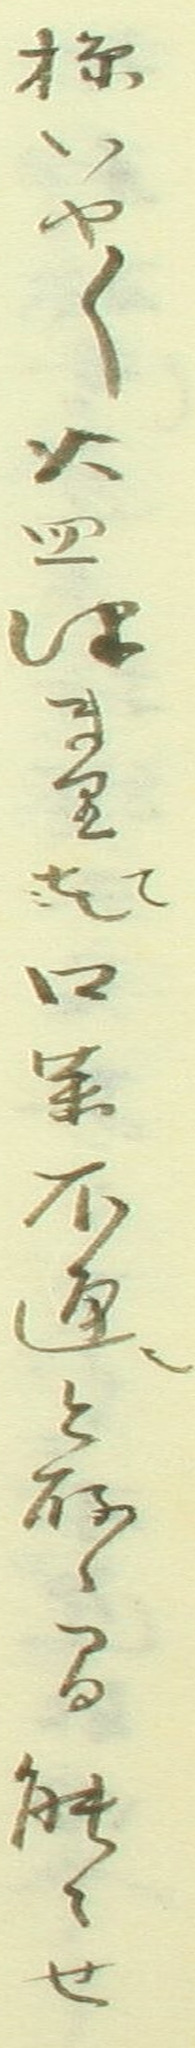様いやいや火皿つまりては口薬不通也と存候間能くせ
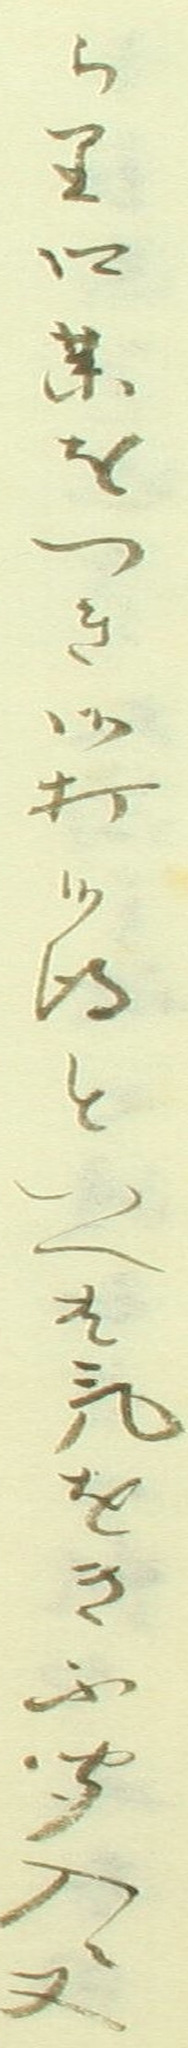らり口薬をつき御打候得といへ共気をき不聞入候又
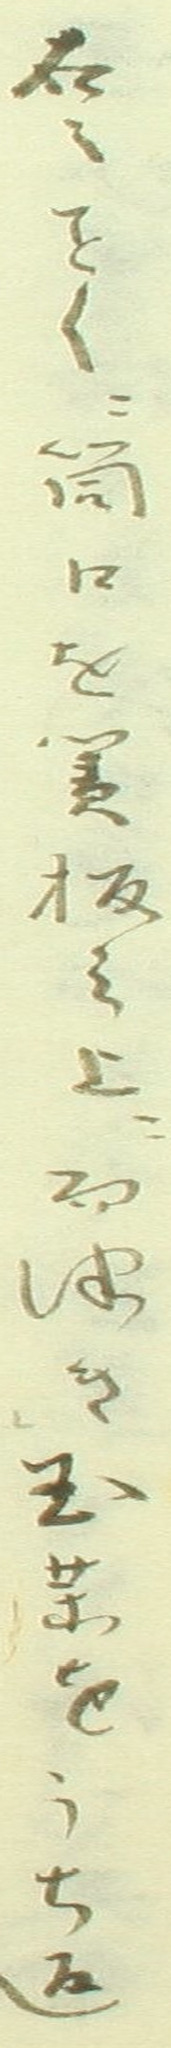右之ことくに筒口を関板之上に而つき玉薬をうち返
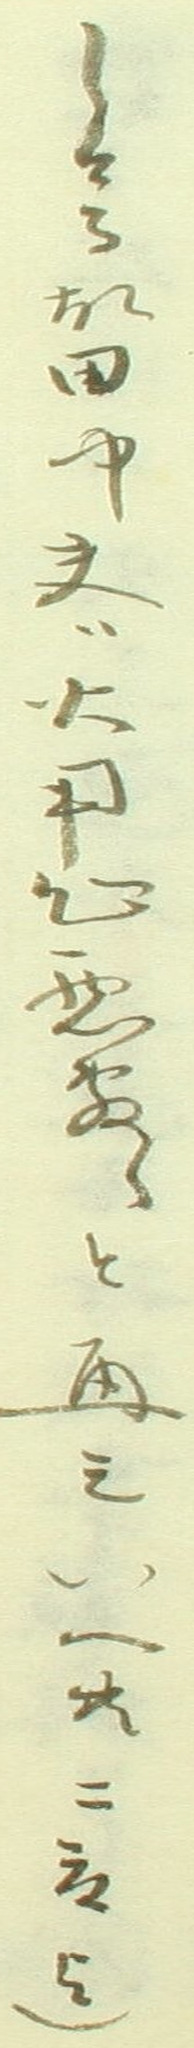しける故田中夫は火用心悪處候と再三いへ共二度迠
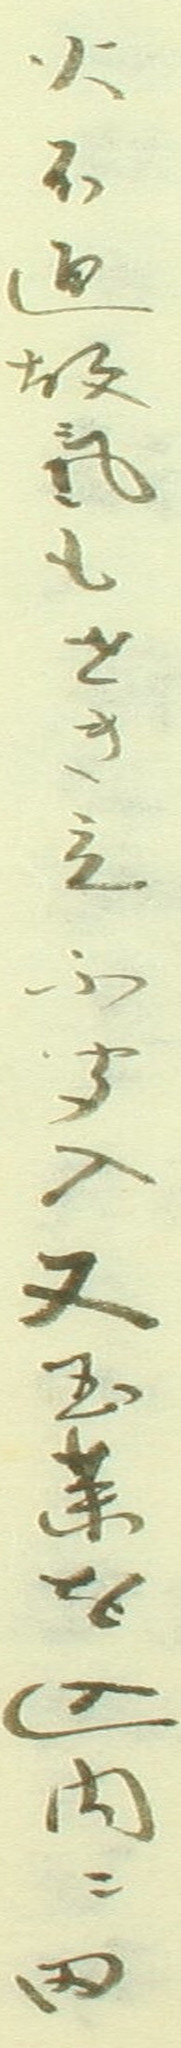火不通故気もせき立不聞入又玉薬を込内に田
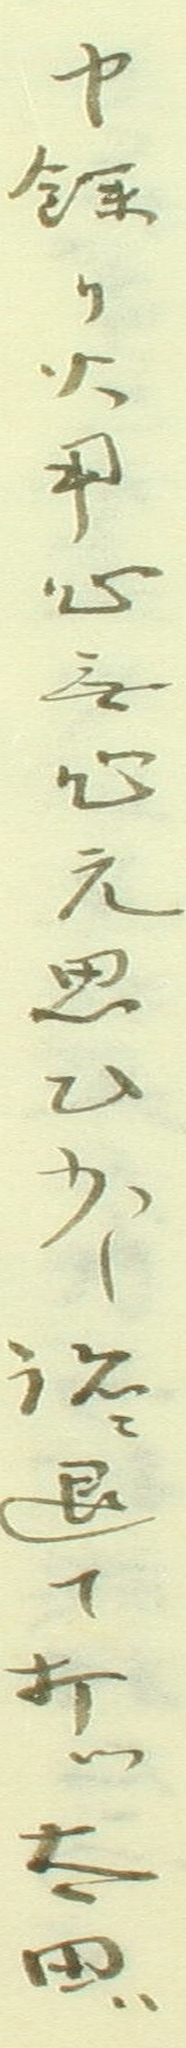中余り火用心無心元思ひ少し諸に退て打つ太田は
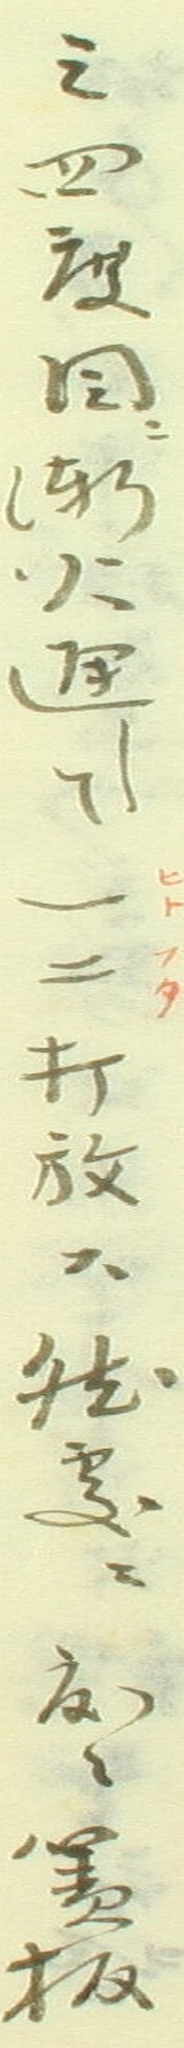三四度目に漸火通して一二打放す然處に度々関板
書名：唐船漂流記 三
